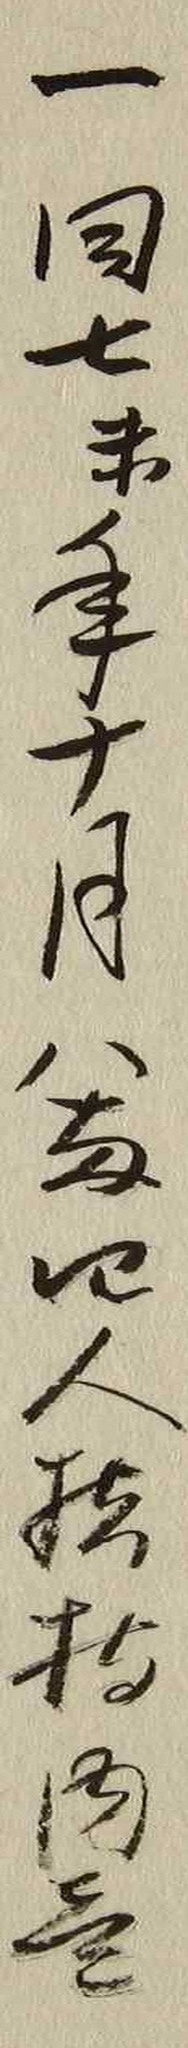一同七未年十月八両四人扶持内壱
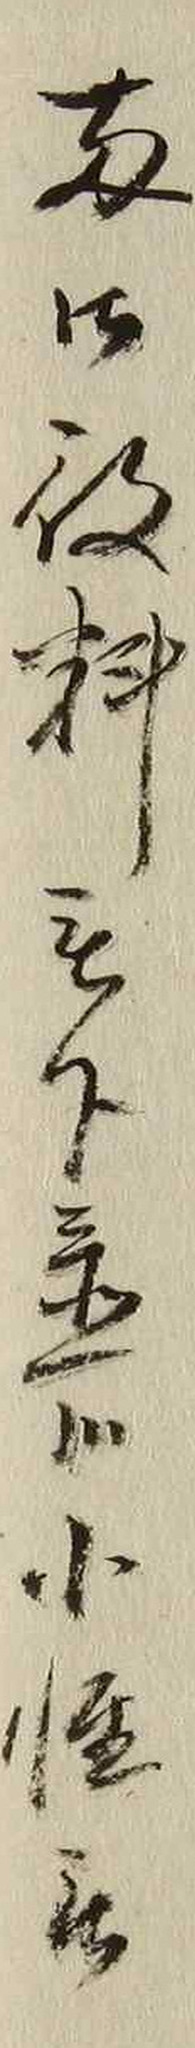両御役料被下置候小性被
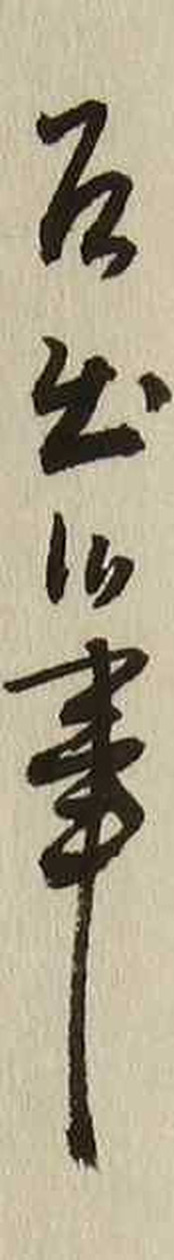召出候事
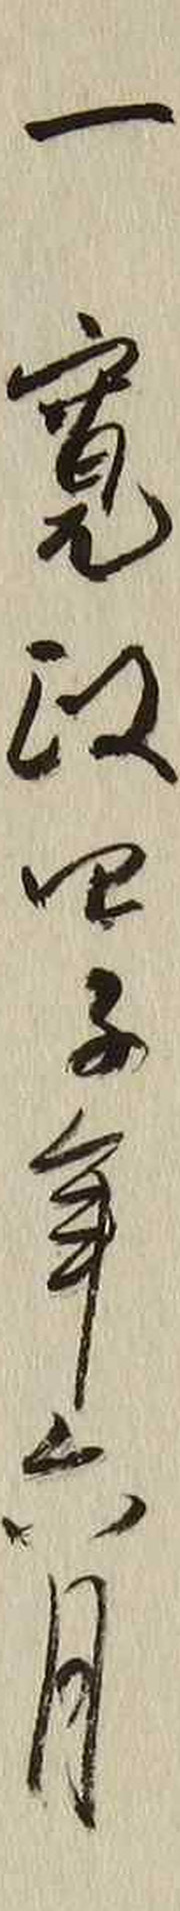一寛政四子年六月
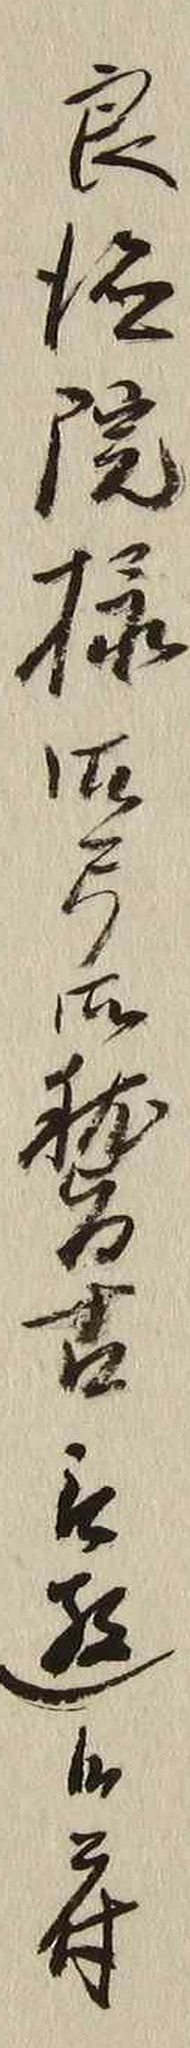良徳院様御弓御稽古被遊候ニ付
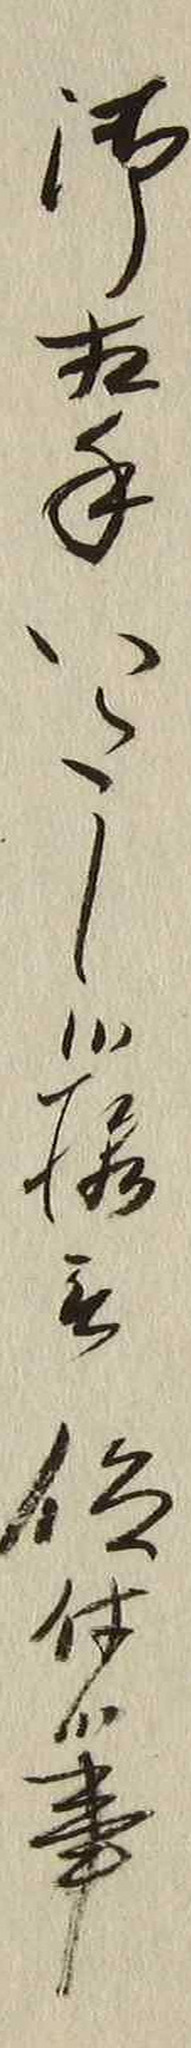御相手いたし候様被仰付候事
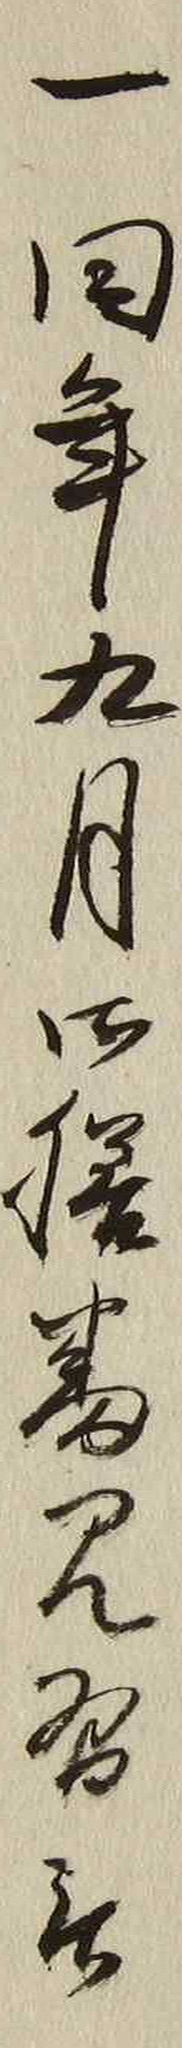一同年九月御膳番見習被
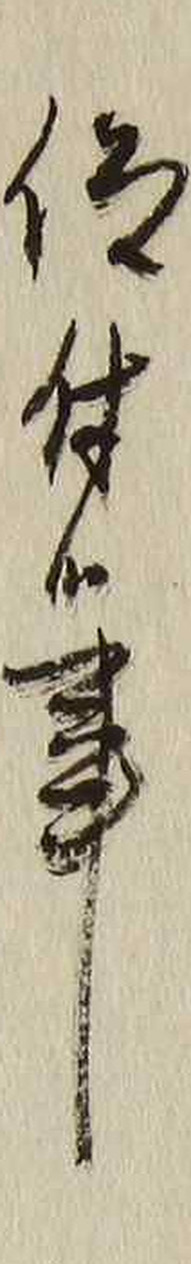仰付候事
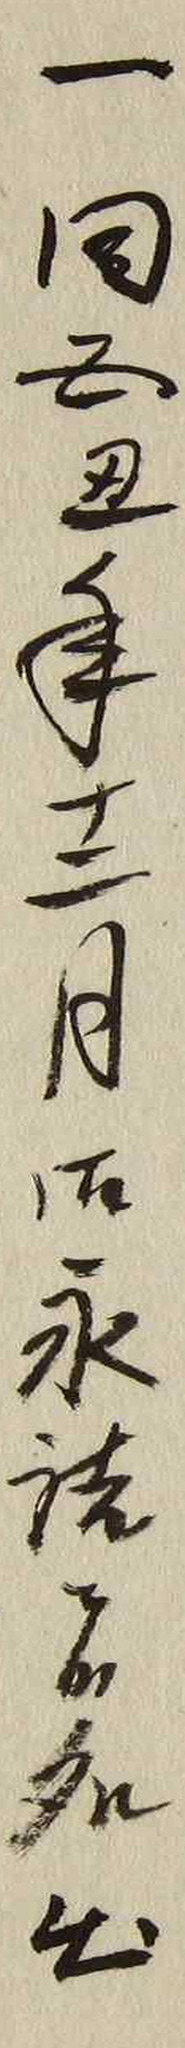一同五丑年十二月御永詰ニ候処出
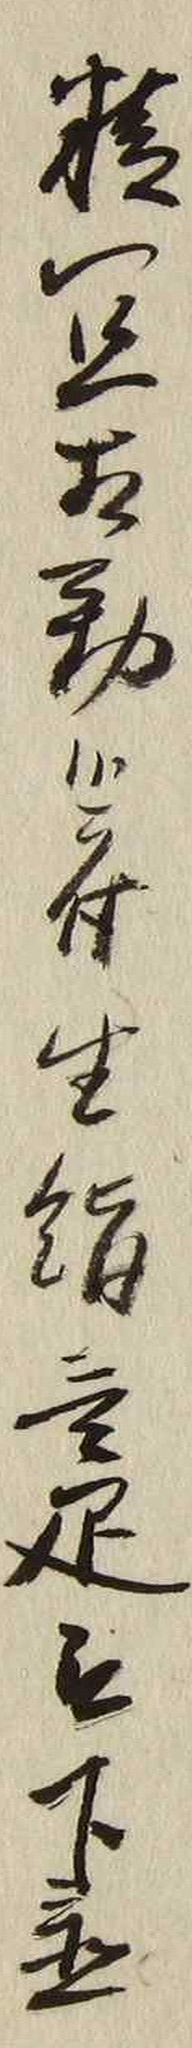精宜相勤候ニ付生絹壱疋被下置
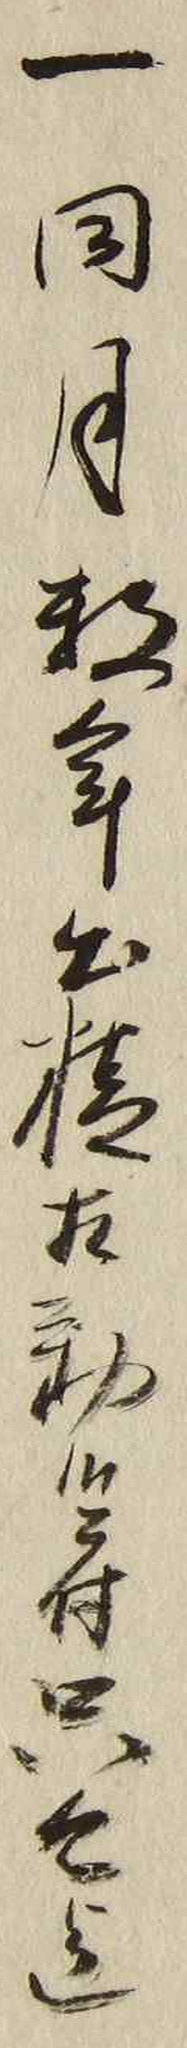一同月数年出精相勤候ニ付只今迄

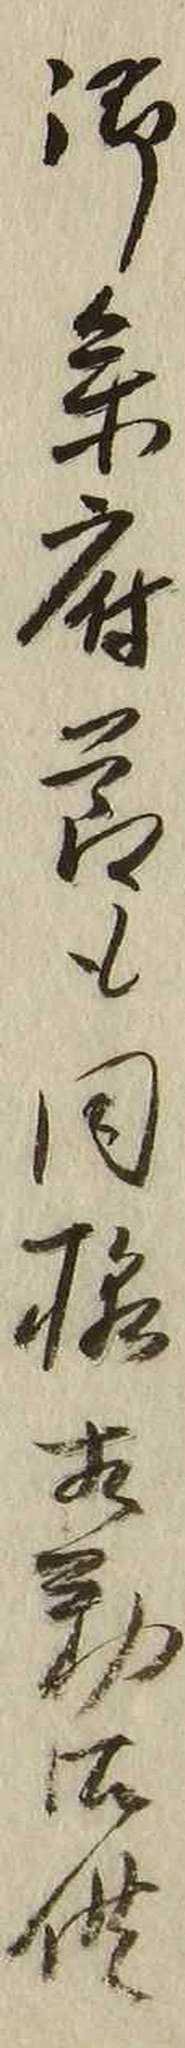御参府節も同様相勤御供
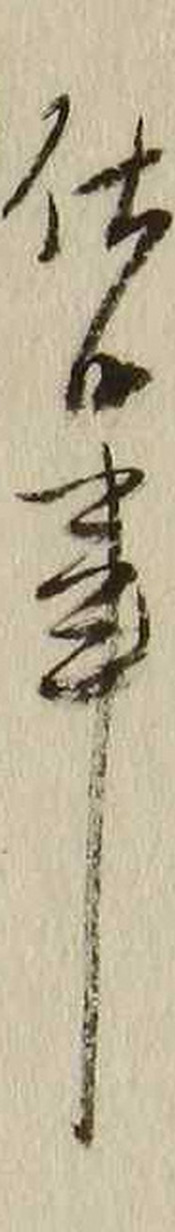仕候事
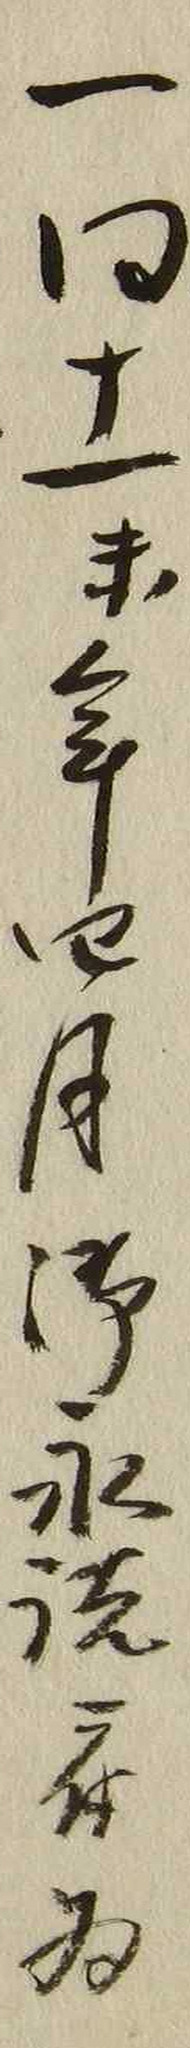一同十一未年四月御永詰ニ付為
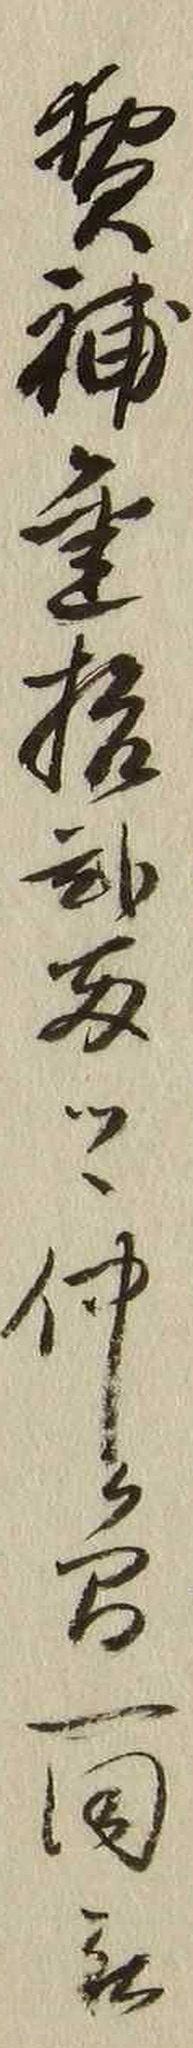費補金拾弐両ツヽ仲ケ間一同被
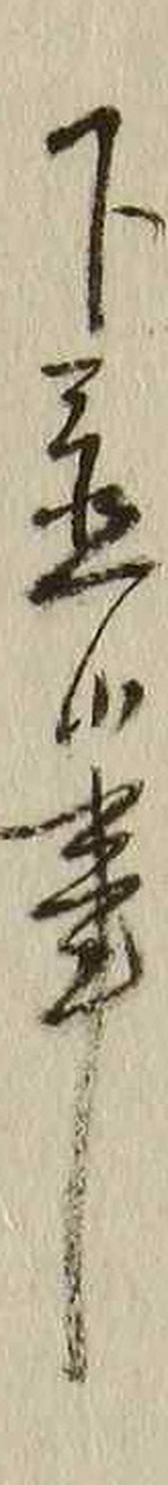下置候事
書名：諸士系譜　巻之346　も之部2
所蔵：会津若松市立会津図書館
